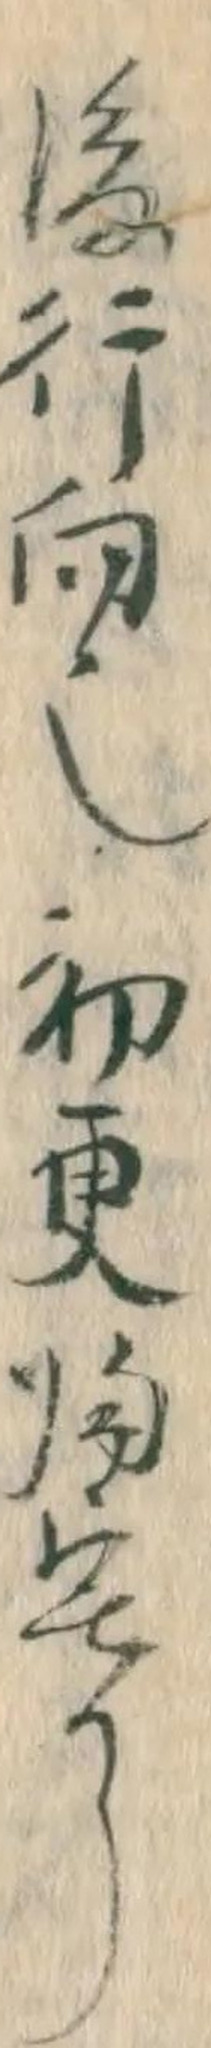後行向也初更帰宅了
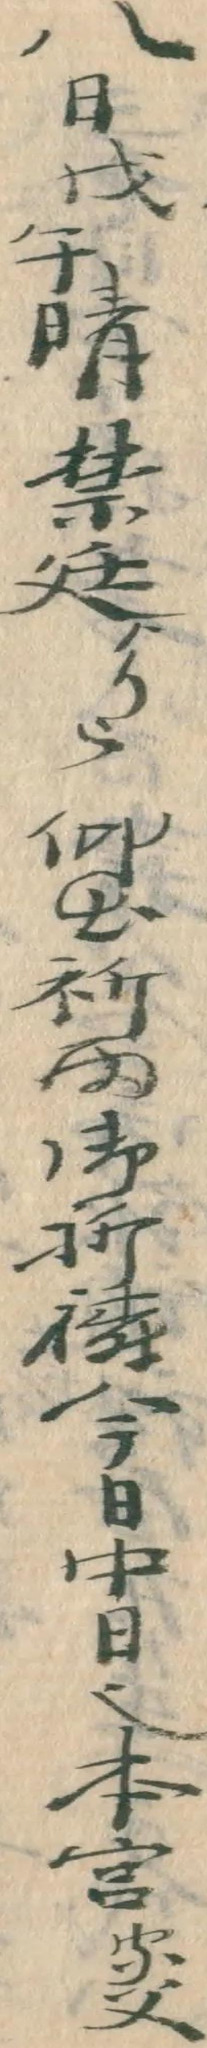八日戊午晴禁廷より被仰出祈両御祈祷今日中日也本宮家父
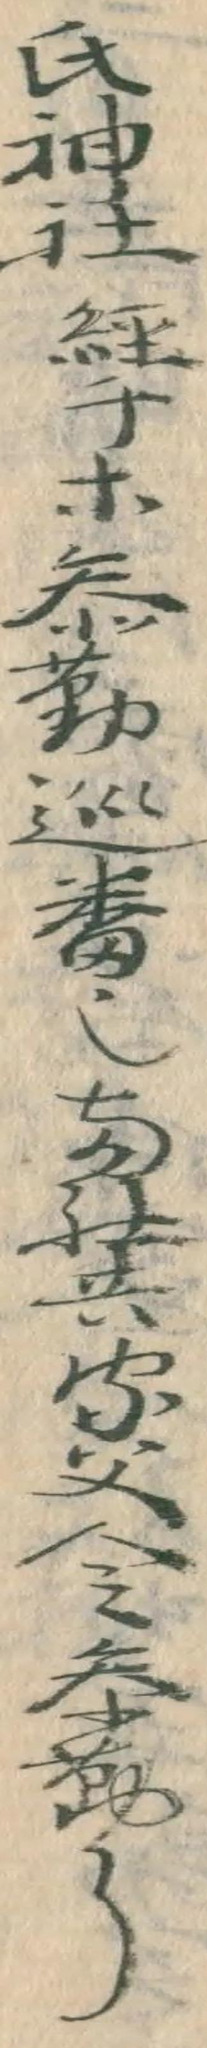氏神社経于等参勤巡番也両社共家父令参勤了
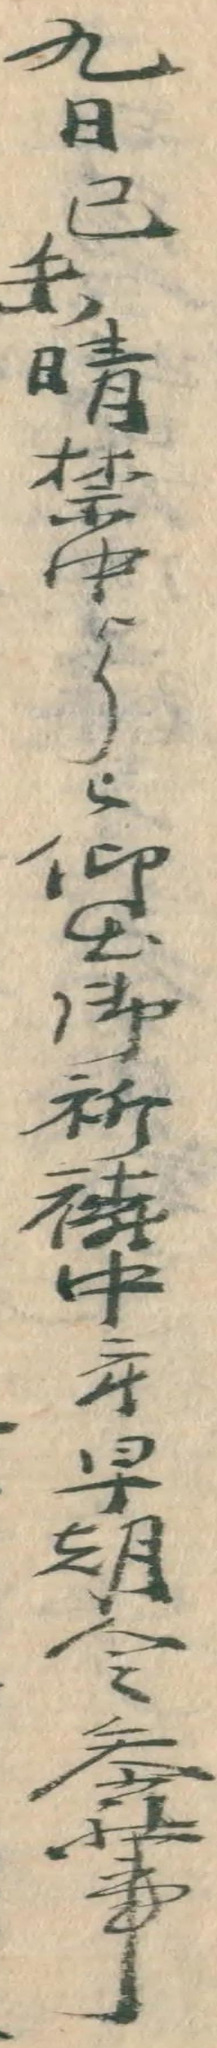九日己巳晴禁中より被仰出御祈祷中ニ付早朝令参社事
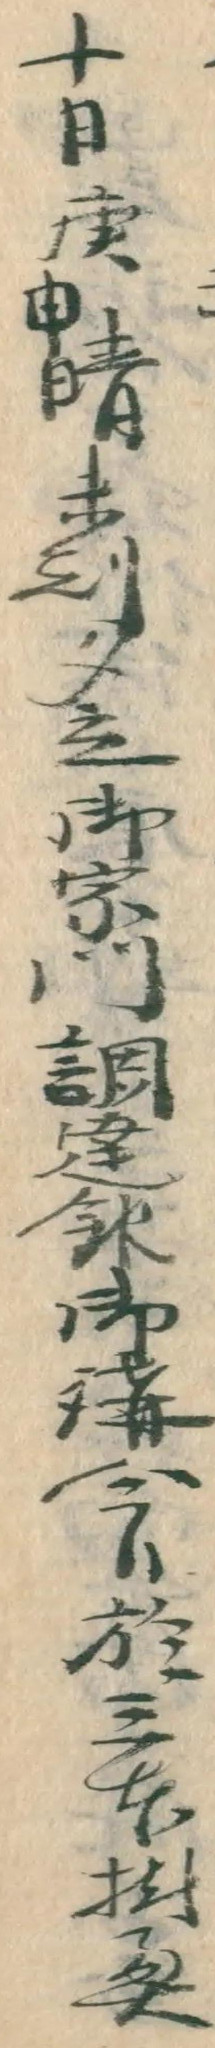十日庚申晴未刻夕立御家門調達録御講今日於三本掛奥

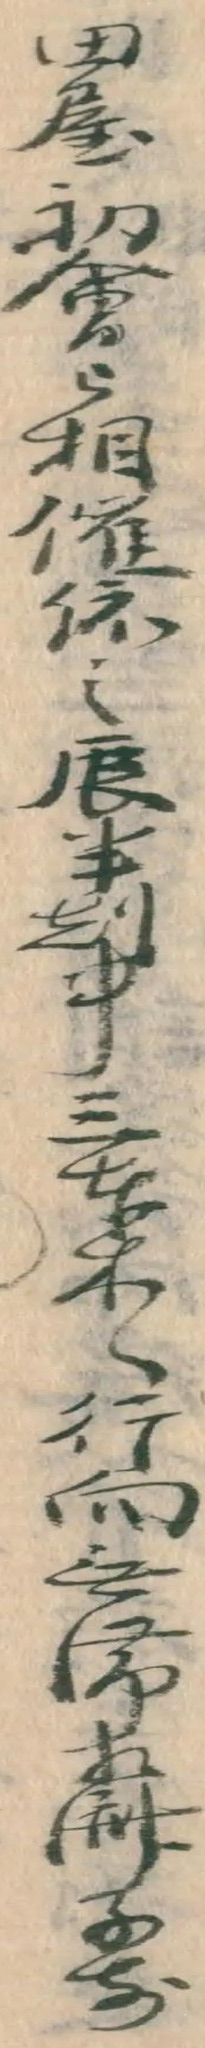田屋初會被相催依之辰半刻斗三本松之行向無滞相済子前
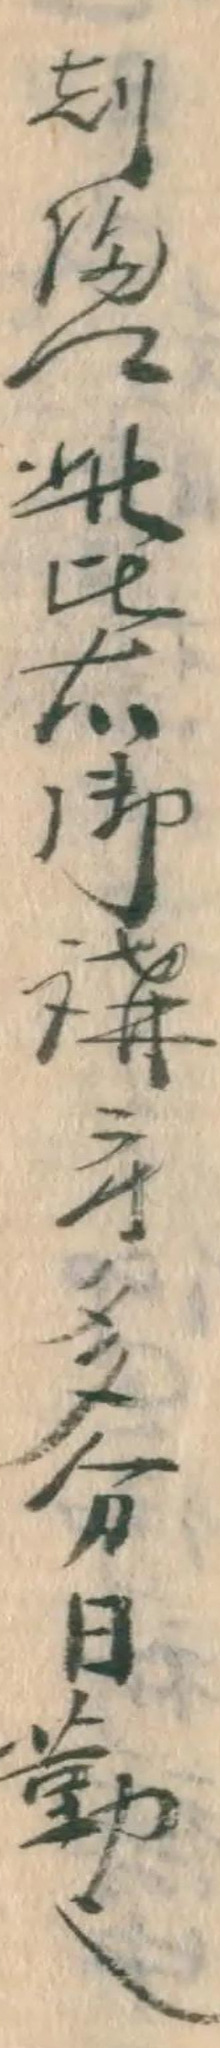刻帰郷此比右御講ニ付多分日勤也
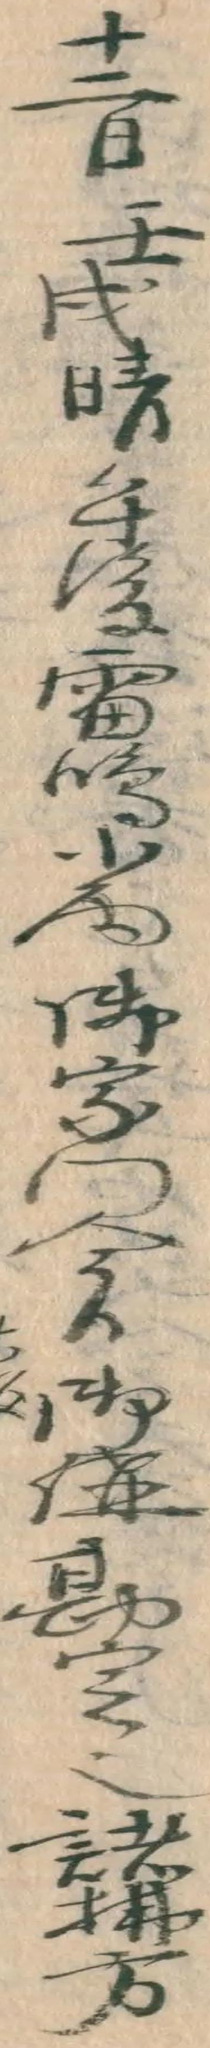十二日壬戌晴午後雷鳴小雨御家門今日御講勘定也諸払万
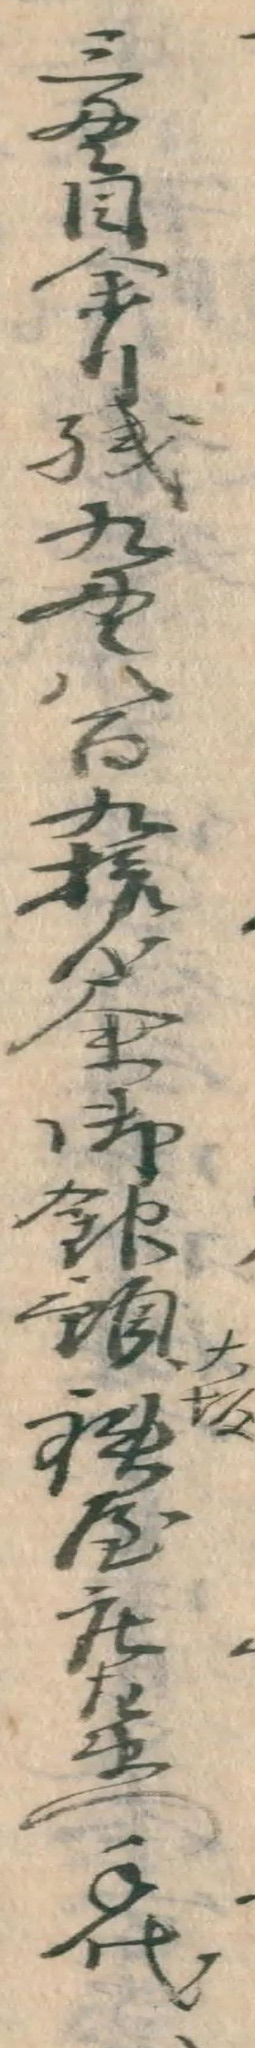三貫目余引残九貫八百九拾歩余御銀預大阪鉄屋庄左衛門手代ヘ
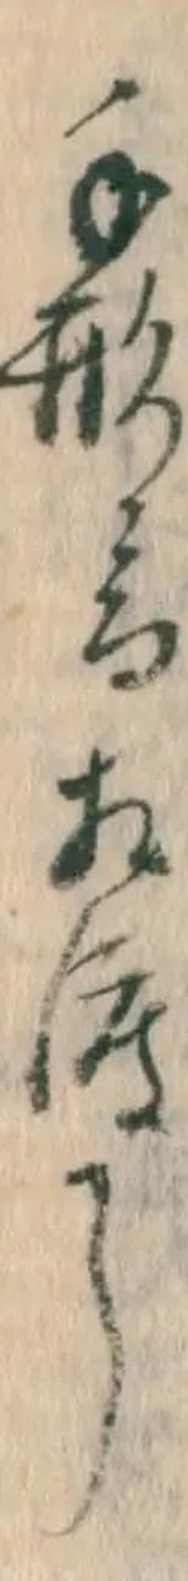手形ニ而相渡了
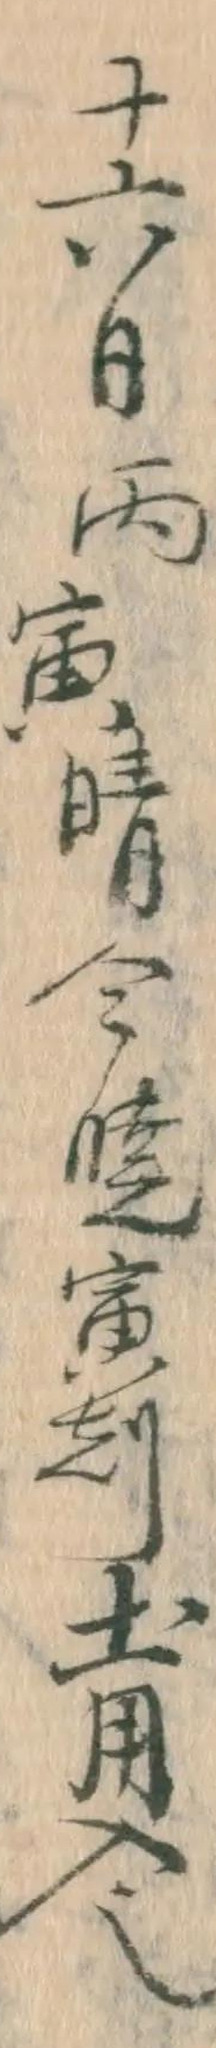十六日丙寅晴今暁寅刻土用入也
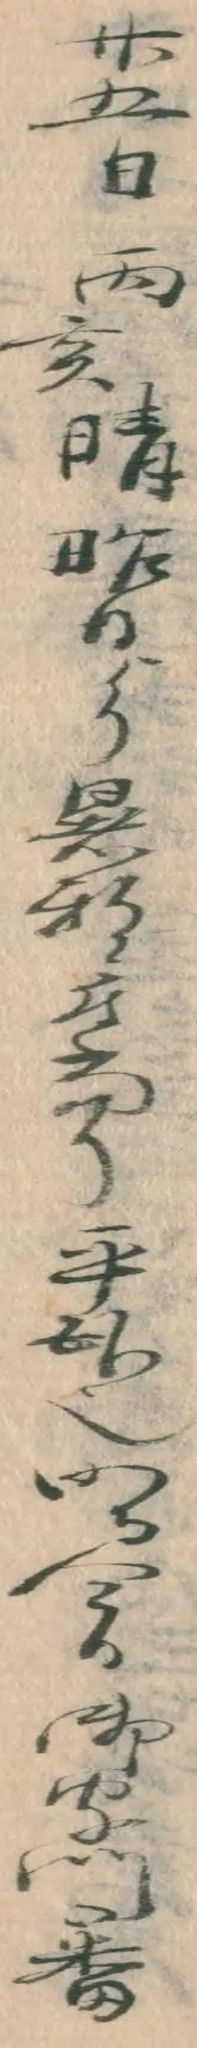廿五日丙亥晴昨日より暑邪ニ付當リ平臥也仍而今日御家門御番
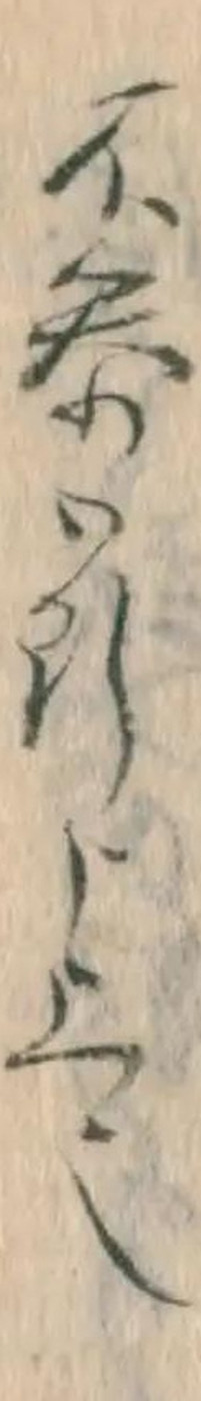不参御断申上候
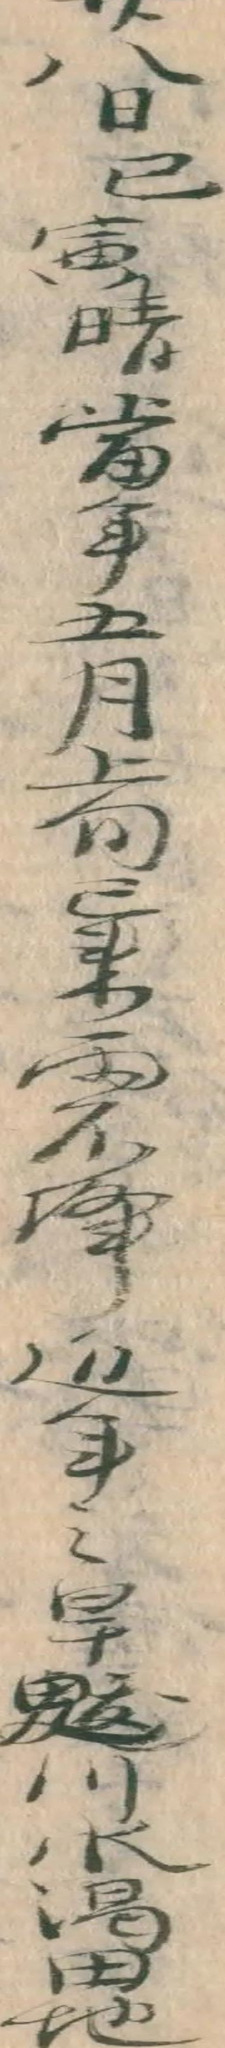廿八日己寅晴當年五月上旬已来雨不降近年之旱魃川水渇田地
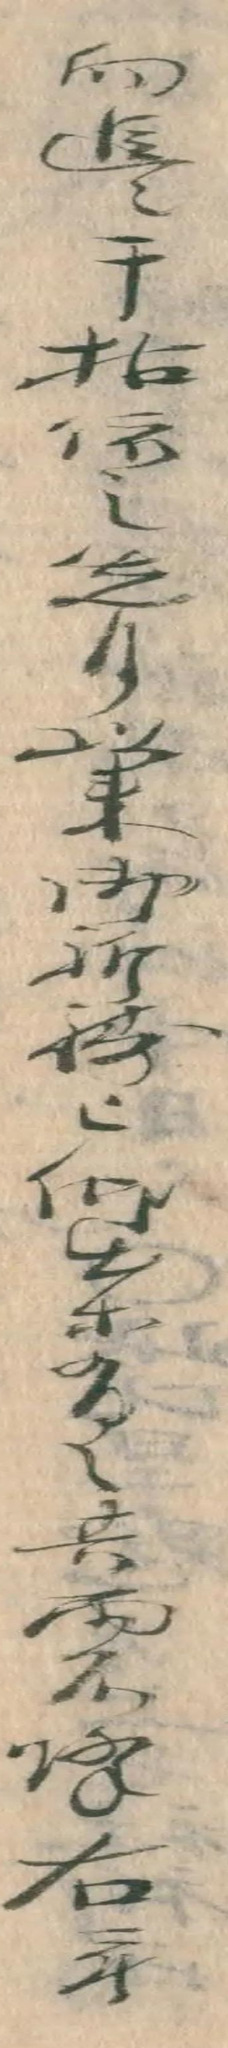向追々干枯依之先月以来御祈祷被仰出等有之其雨不降右ニ付
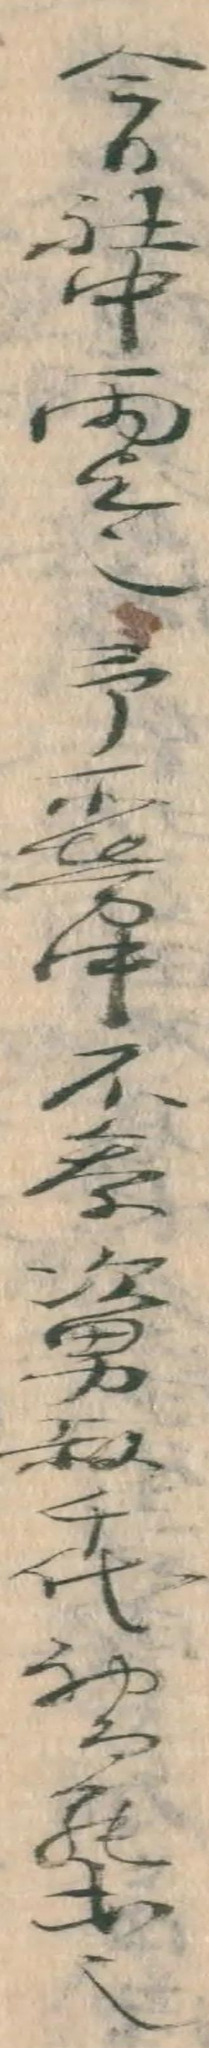今日社中雨乞也予所労中不参次男叔千代初而罷出也
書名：賀茂社記録. 第65冊
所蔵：国立国会図書館 National Diet Library, JAPAN
